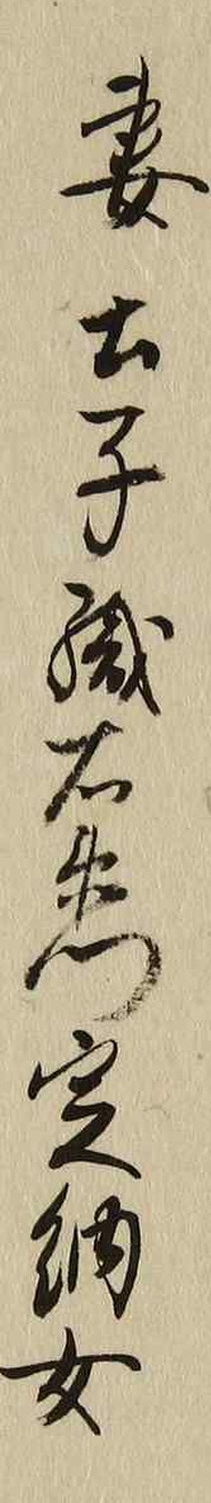妻土子織右衛門定納女
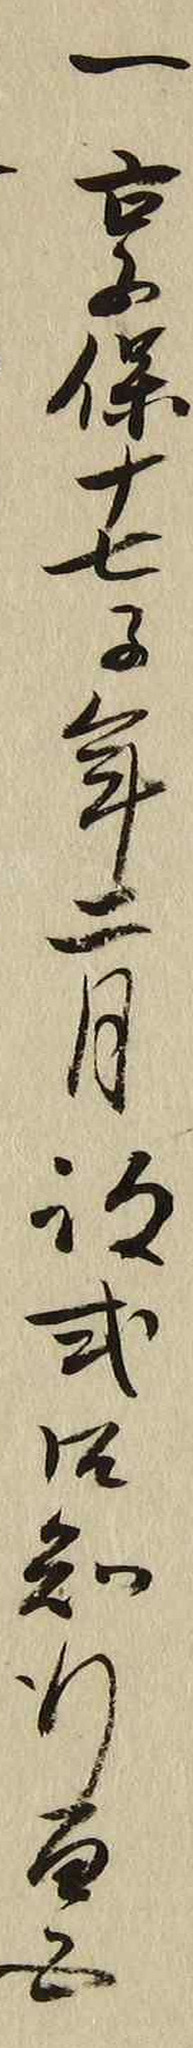一享保十七子年二月跡式御知行百五
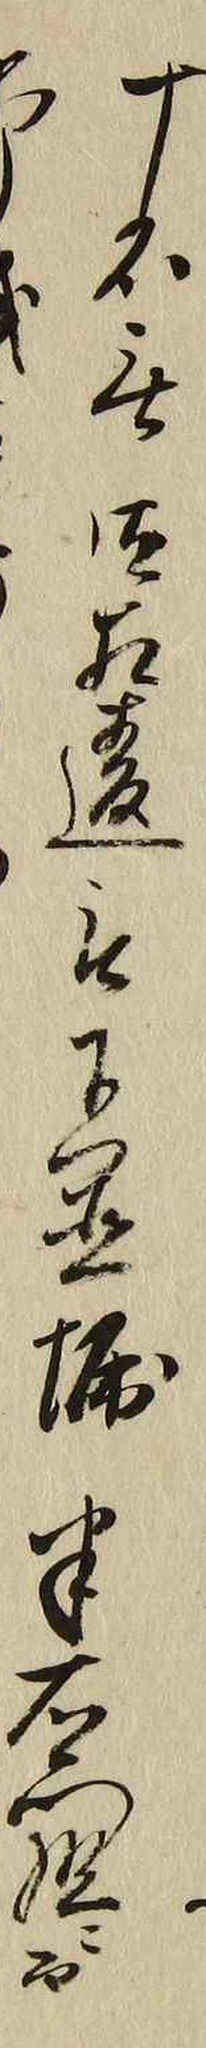十石無御相違被下置堀半右門組ニ而
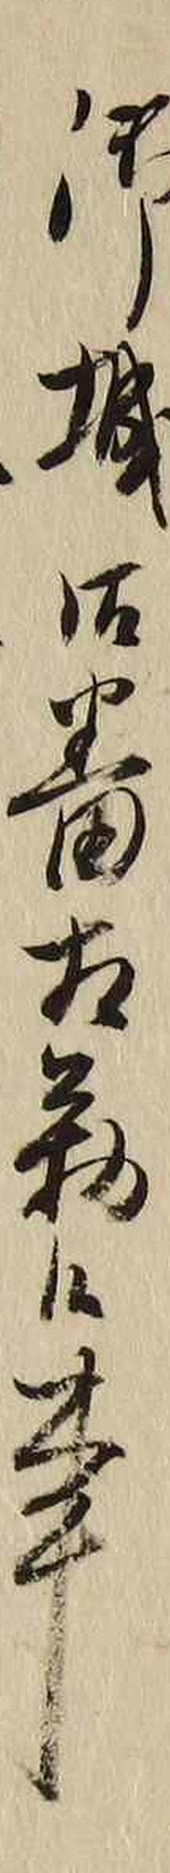御城御番相勤候事
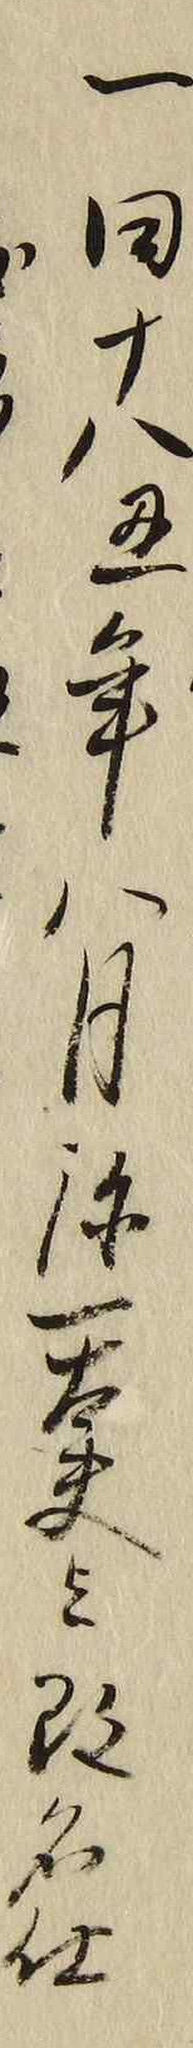一同十八丑年八月弥一太夫与改名仕
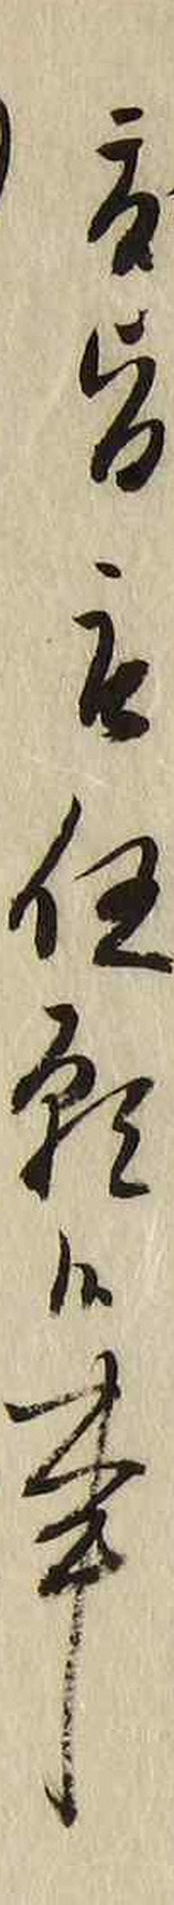度旨被任願候事
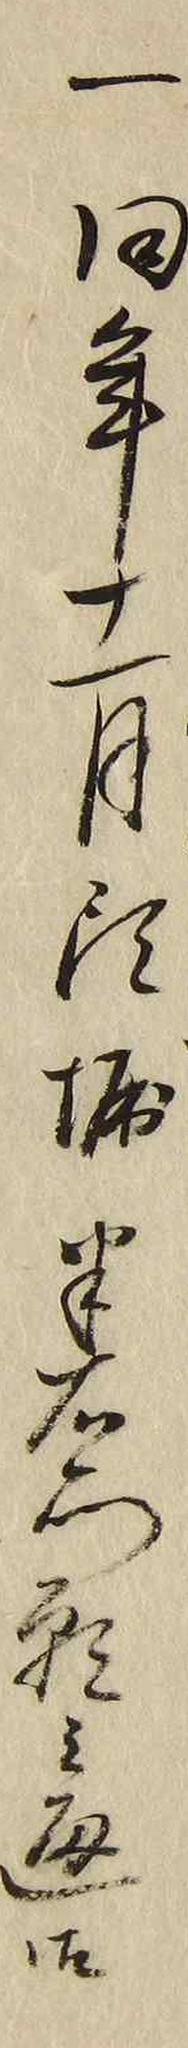一同年十一月頭堀半右衛門願之通御

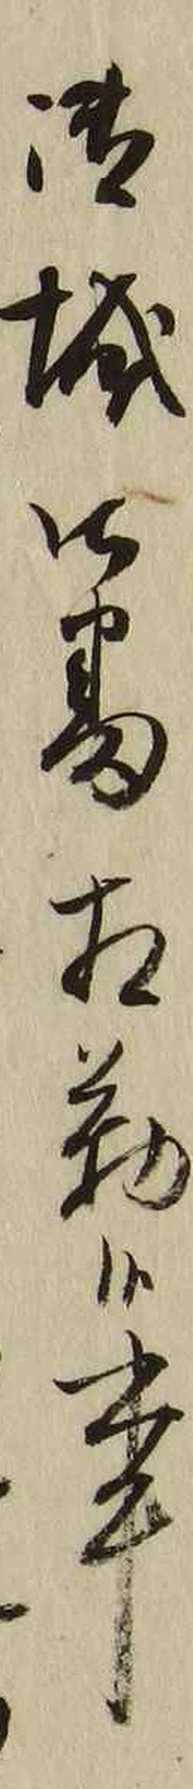御城御番相勤候事
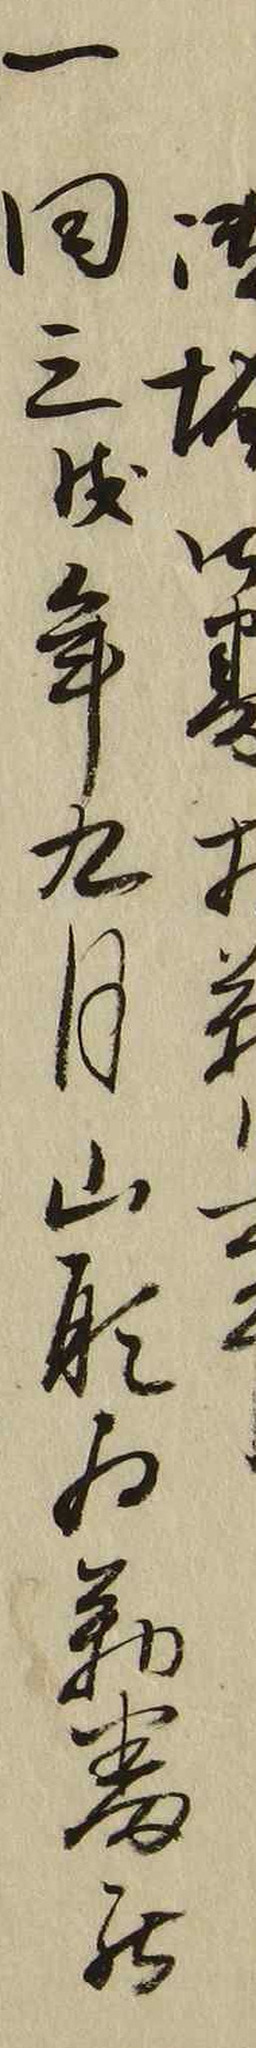一同三戌年九月山形為勤番罷
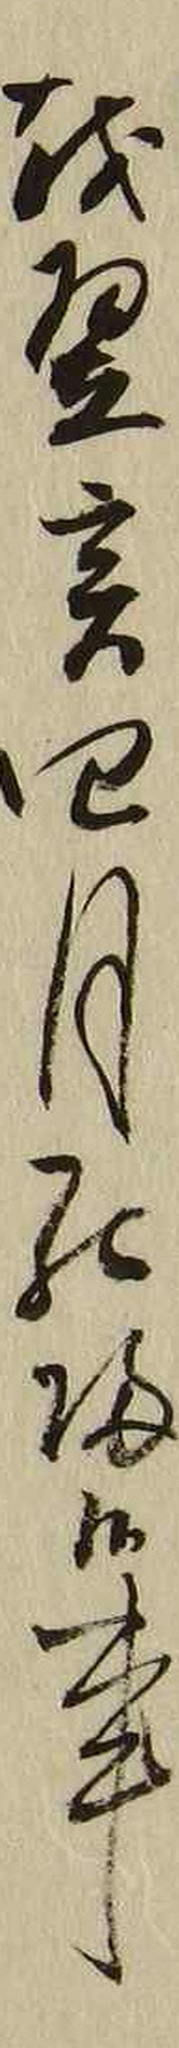越翌亥四月罷帰候事
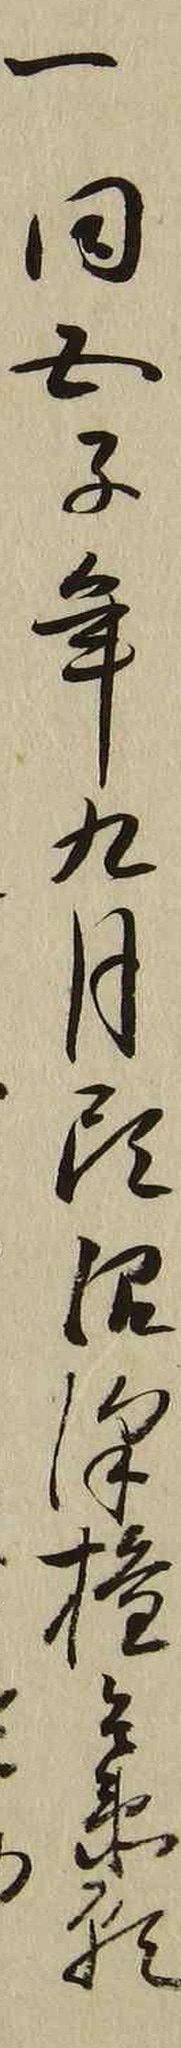一同五子年九月頭沼津権兵衛願
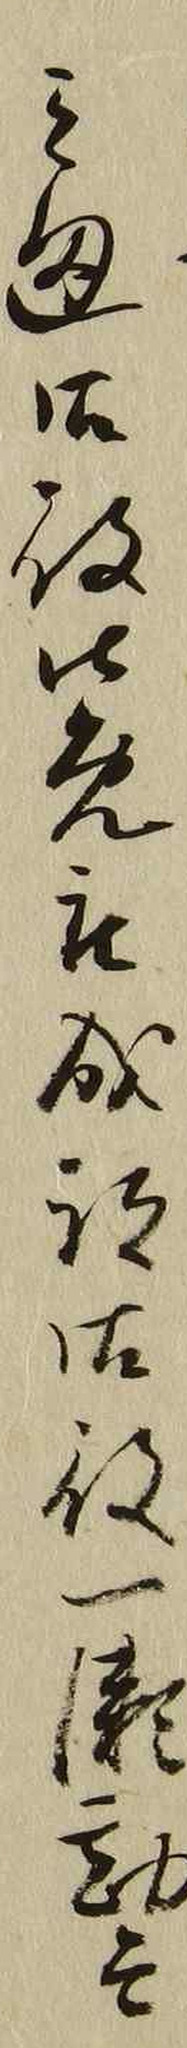之通御役御免被成跡御役一瀬勘兵
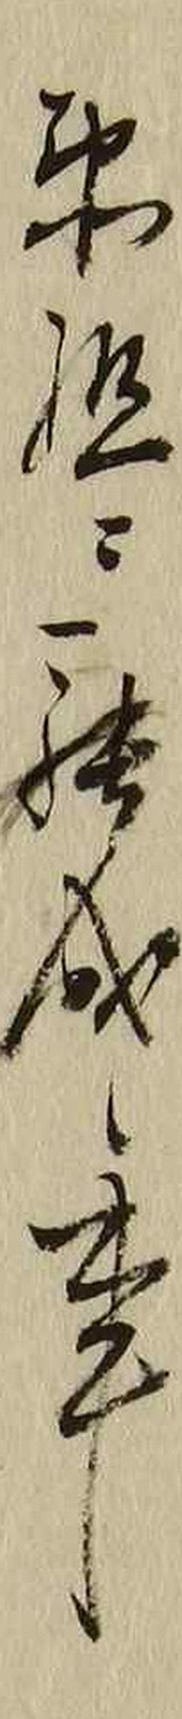衛組ニ罷成候事
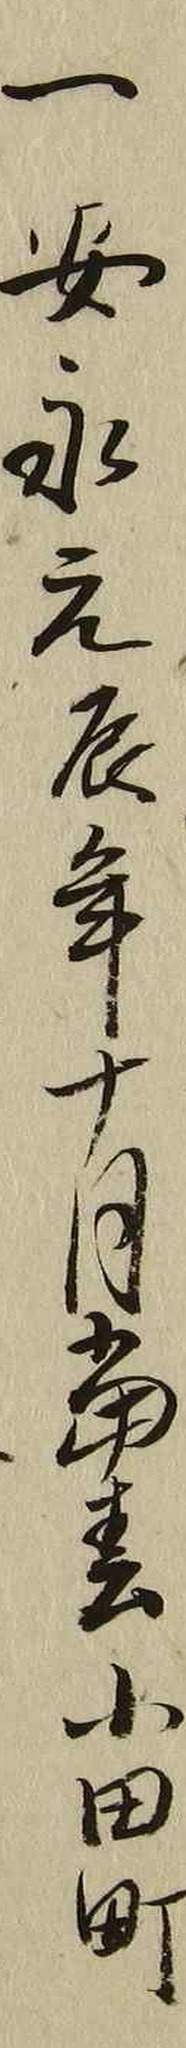一安永元辰年十月当春小田町
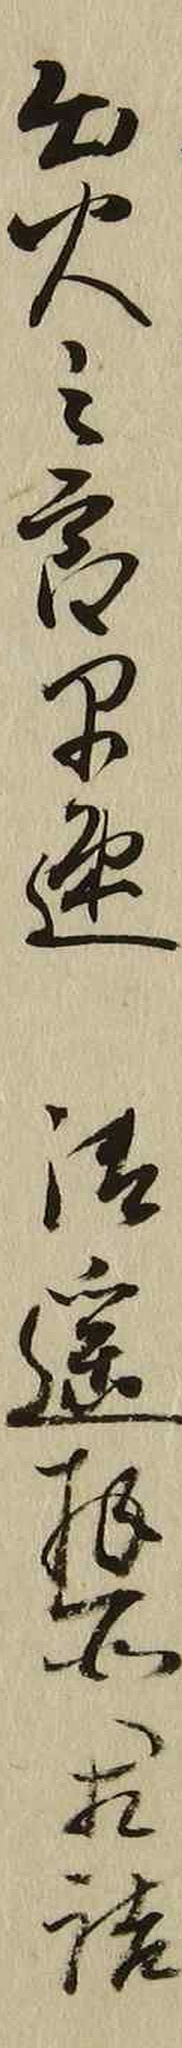出火之節早速御遥拝所へ相詰
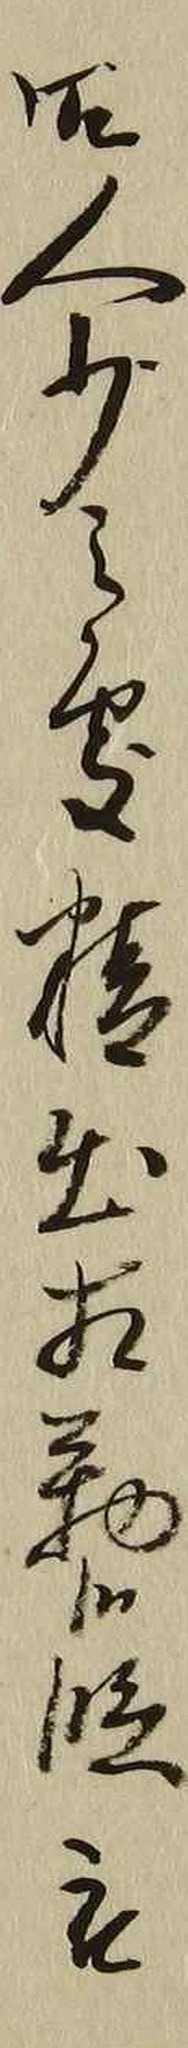御人少之処精出相勤候段被
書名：諸士系譜　巻之348　も之部4
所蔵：会津若松市立会津図書館
